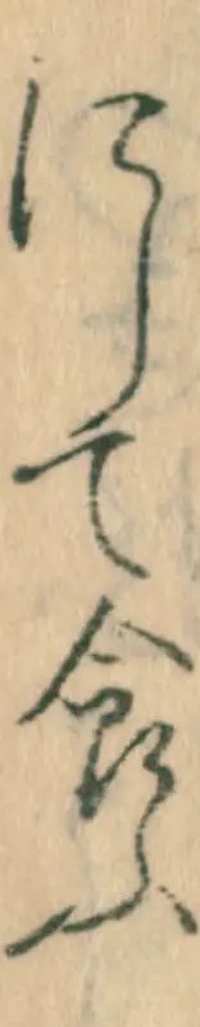にして食ふ
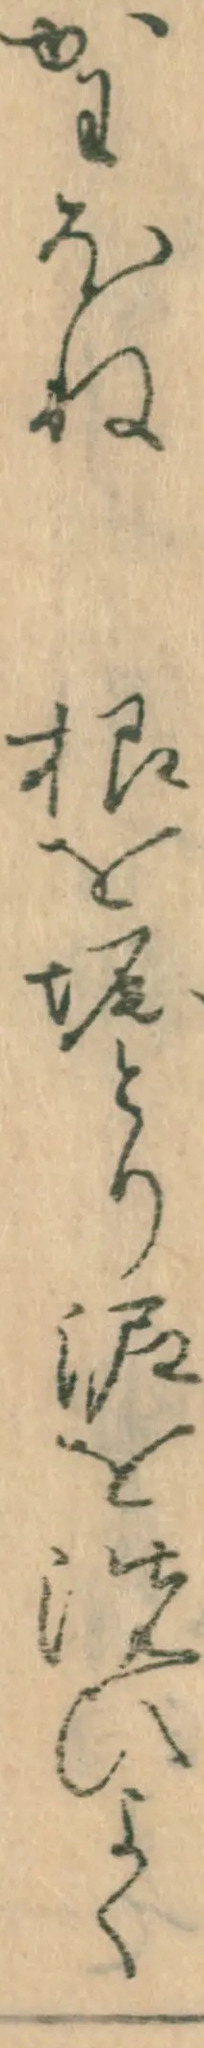かわほね根を堀とり泥を洗ひよく
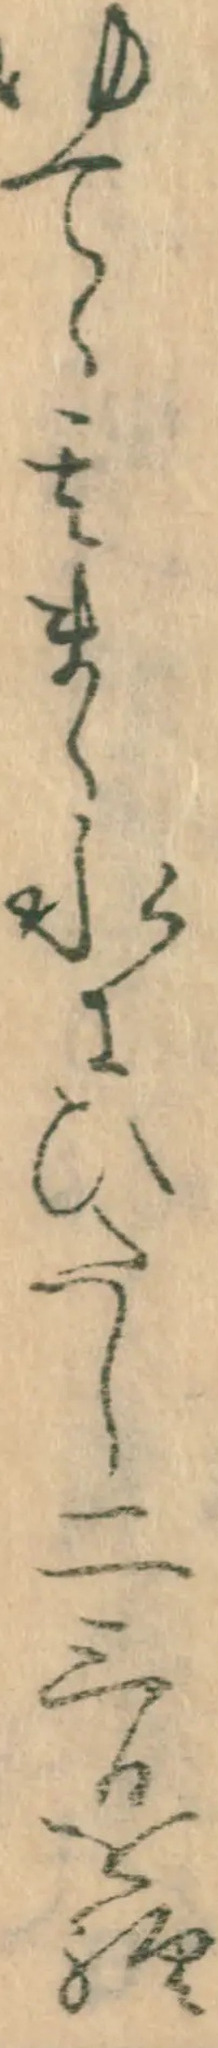ゆてゝ其まゝ水にひたし二三日を経
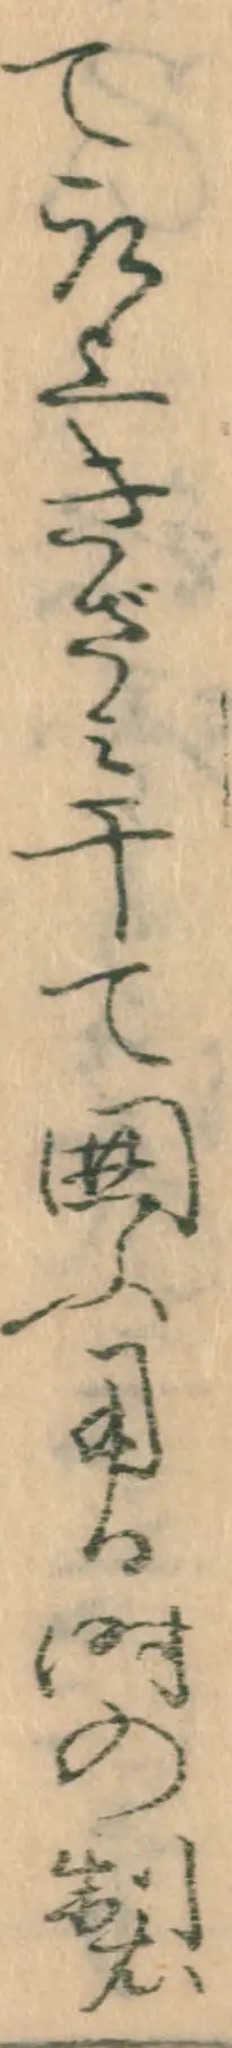て取上きざみ干て囲ふ用る時の製
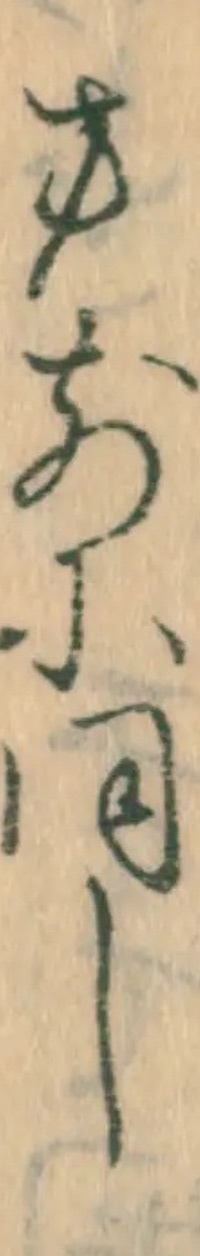方前に同し
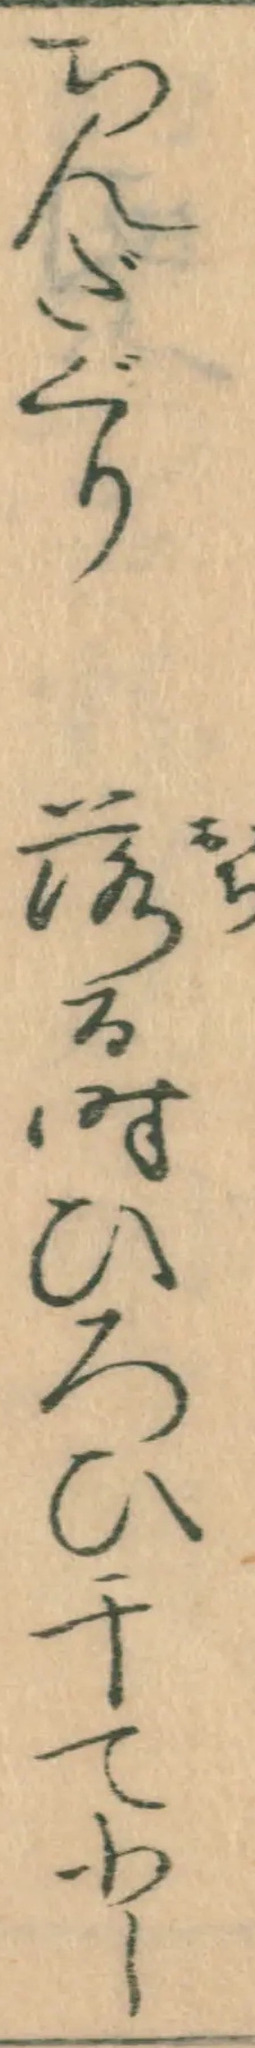ちんだぐり落る時ひろひ干て少し
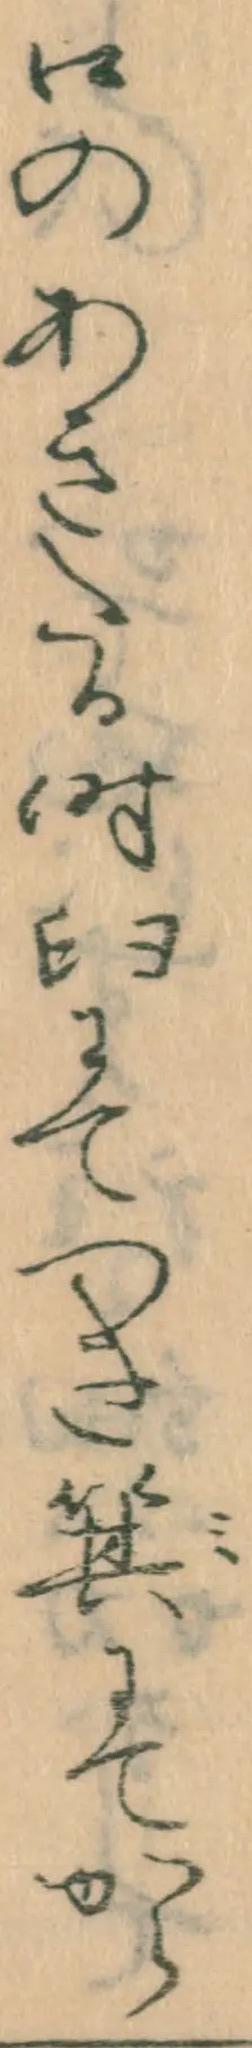口のあきたる時臼にてつき箕にてから
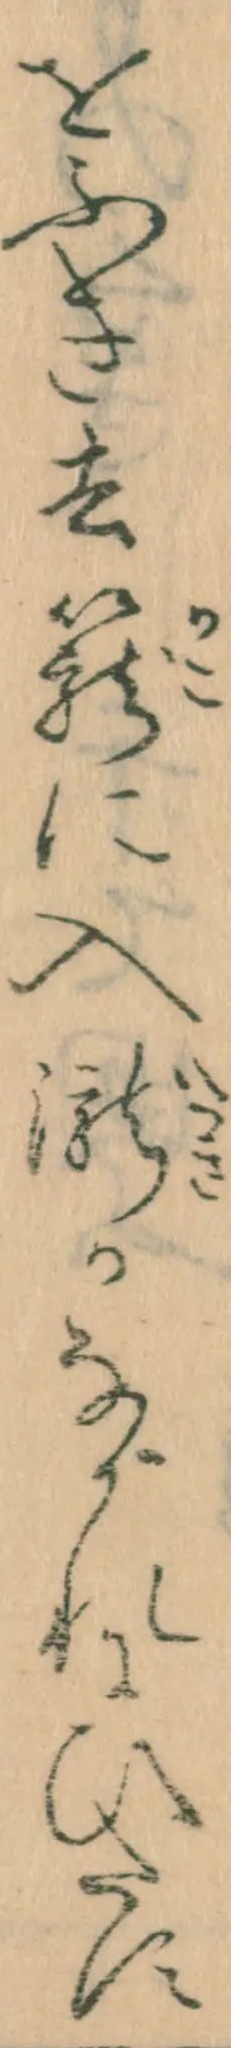をふき去篭に入滝かながれにひたす
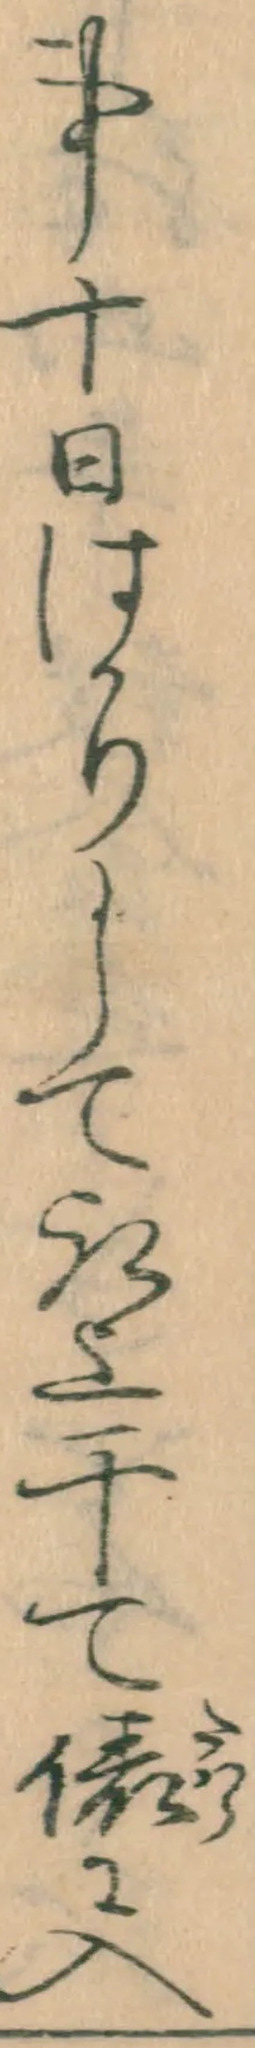事十日はかりして取上干て俵に入
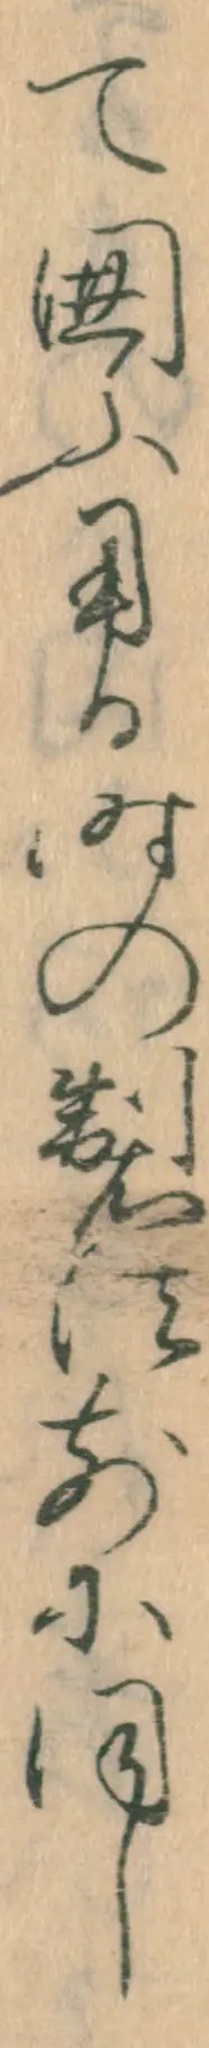て用ふ用る時の製法前に同し
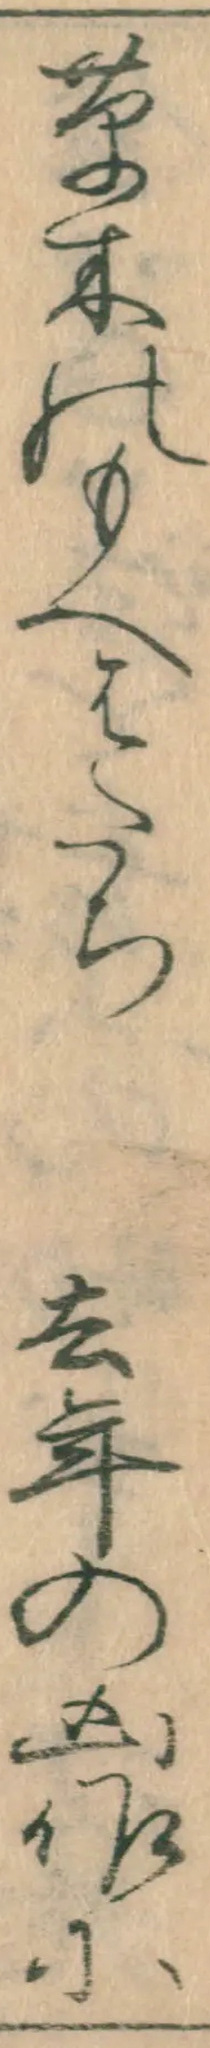草木のもへはたち去年の凶作に
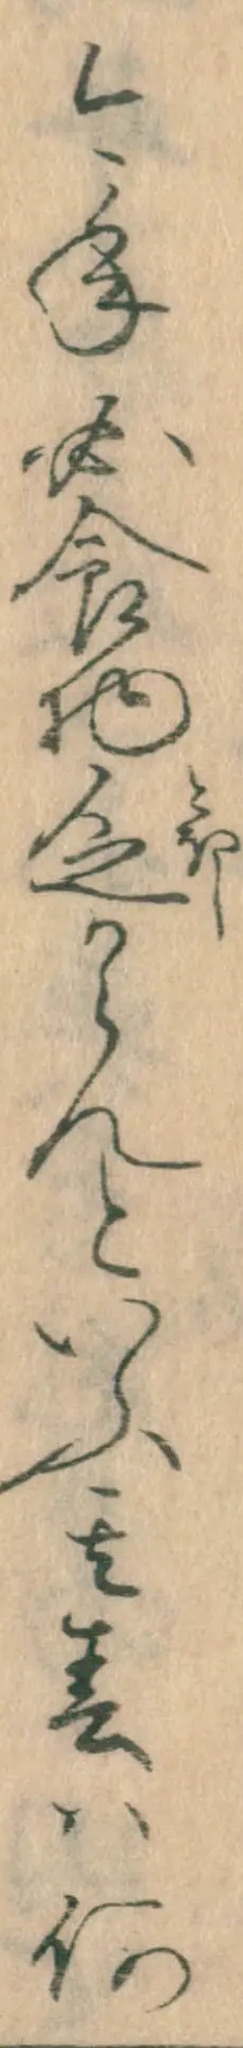今年必食物乏からんといふ其春は何
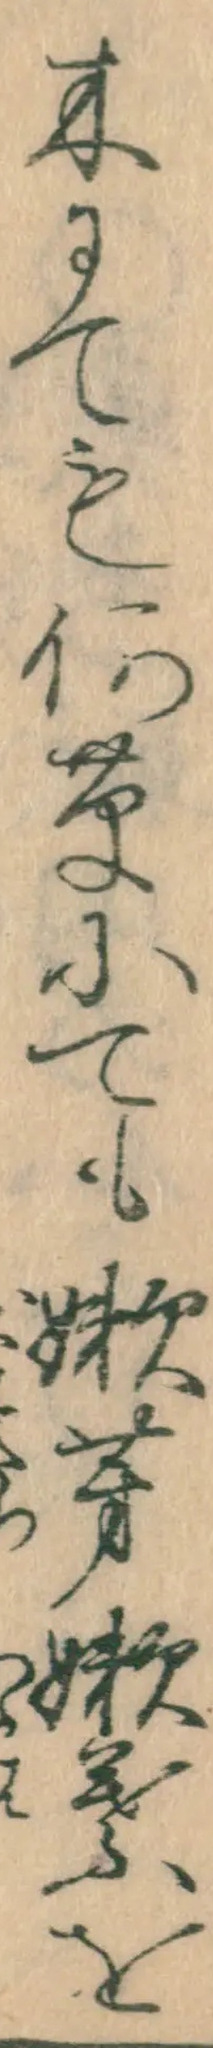木にても何草にても嫰芽嫰葉を
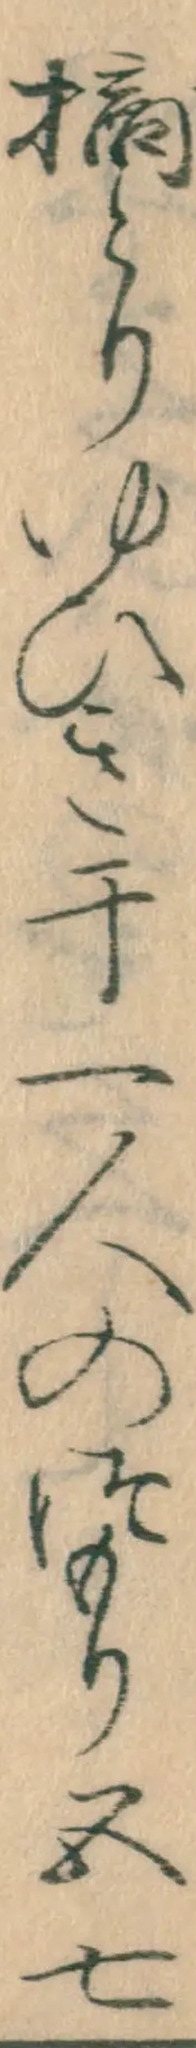摘とりゆひき干一人のつもり五七
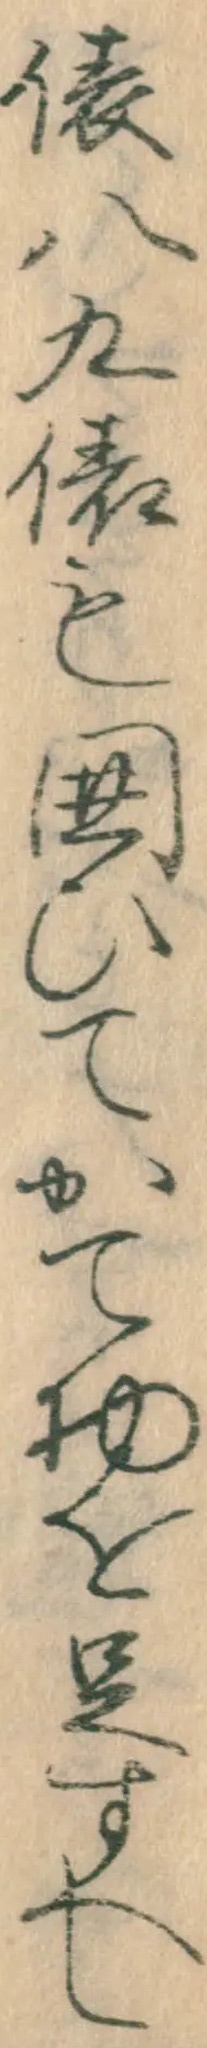俵八九俵も囲ひてかて物を足すへし
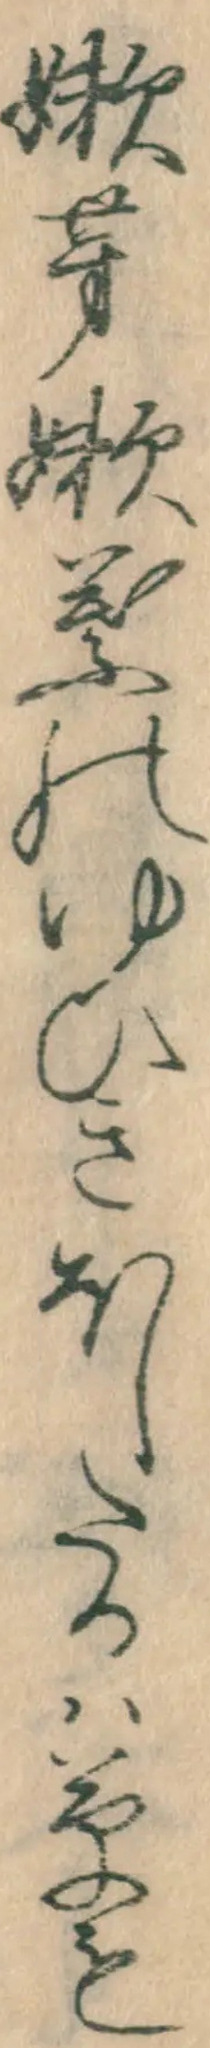嫰芽嫰葉のゆひきほしたるは草も
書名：かてもの
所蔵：国立国会図書館 National Diet Library, JAPAN
